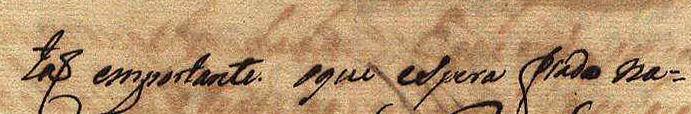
taõ importante. o que espera fiado na
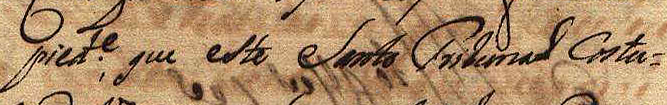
pied̄.e que este Santo Tribunal Costu
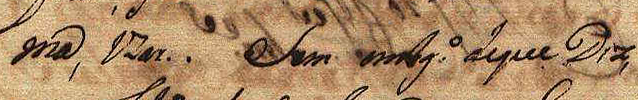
ma, vzar. Sem embg.o de que Diz,
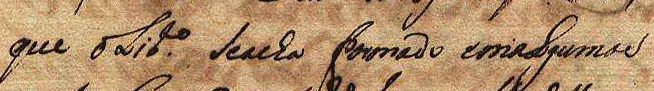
que o Lib.o se acha formado em algumas
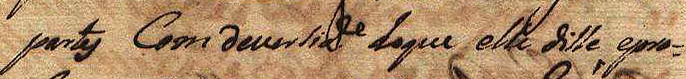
partes Com deversid.e do que elle disse, e pro
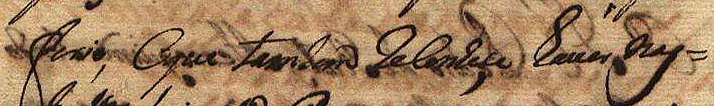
ferio, O que tambem Reconhece hauer nas
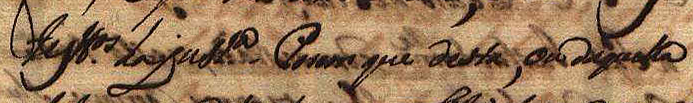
test.as da just.a. Porem que desta, ou daquella
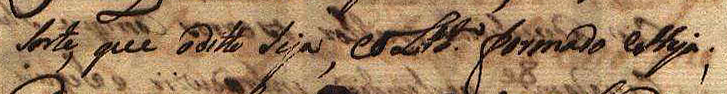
sorte, que o ditto seja, e o Lib̄.o formado esteja;
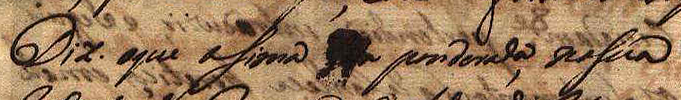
Diz. o que asima _ ponderada, na sua
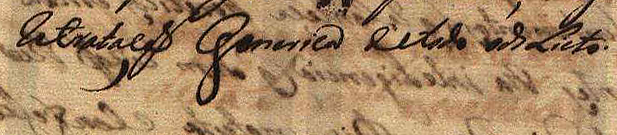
Retrataçaõ Generica de todo o diLicto.
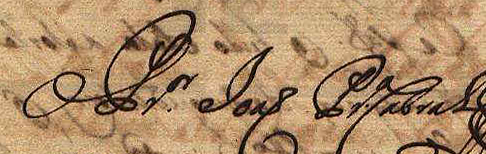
O Pr.or Ioaõ Pr.a Cabral
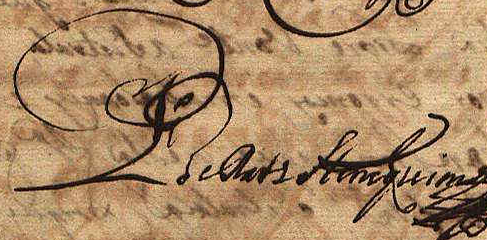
Po de Rates Henequim
